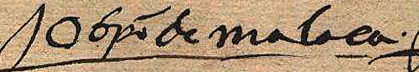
O bpō de malaca
